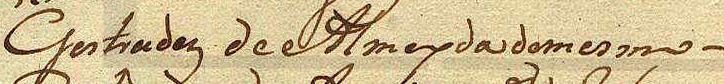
Gestrudez de Almeyda do mesmo
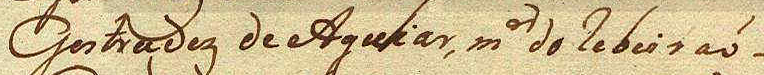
Gestrudez de Aguiar, m.or do Rebeiraõ
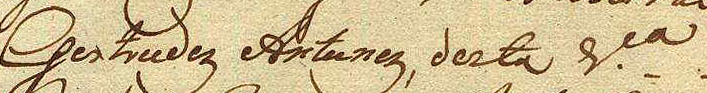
Gertrudez Antunez, desta V.a
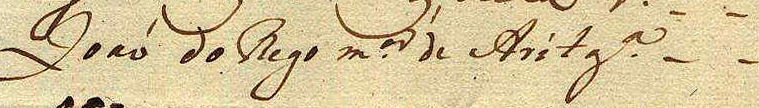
Joaõ do Rego m.or de Aritg.a
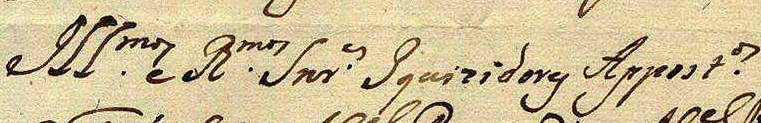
Ill.mos e R.mos Snr.es Iquizidores Appost.os
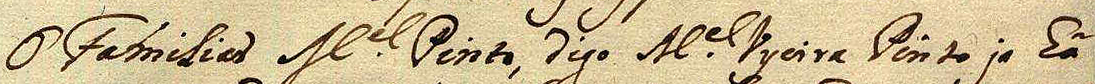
O Familiar M.el Pinto digo M.el Vyeira Pinto ja há
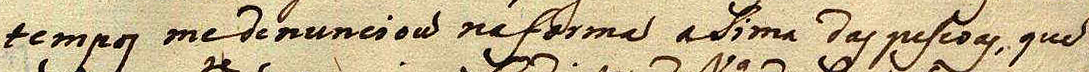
tempos me denunciou na forma asima das pessoas, que
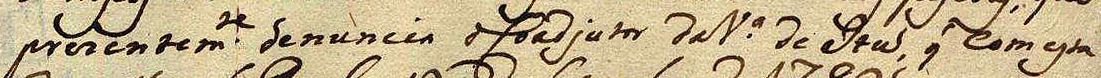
prezentem.te denuncia o Coadjutor da V.a de Itu, q̄ com esta
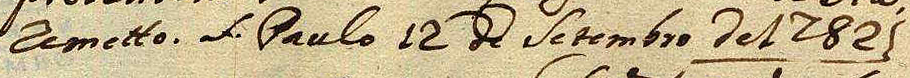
Remetto. S. Paulo 12 de Setembro de 1782
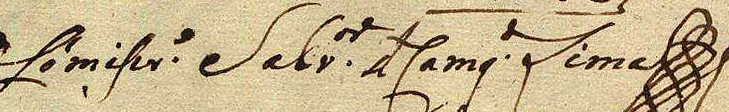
O Comissr.o Salv.o d̄ Camg.o Lima
